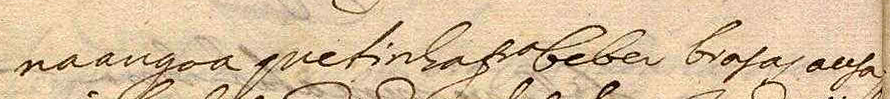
na augoa que tinha pa beber brasas acesa
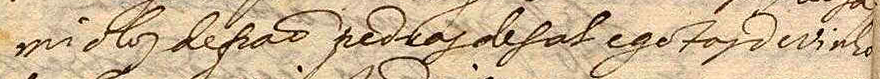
miolos de paõ pedras de sal e gotas de vinho
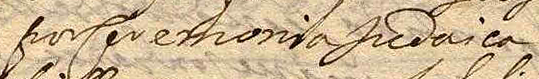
por Ceremonia Judaica
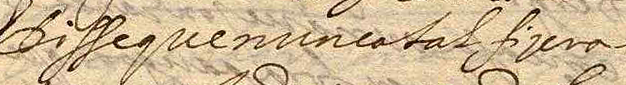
Disse que nunca tal fizera
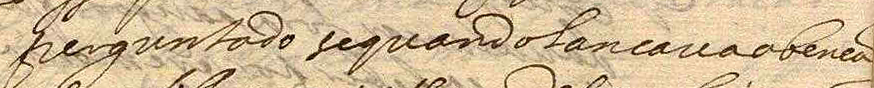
perguntado se quando lançaua a bençā
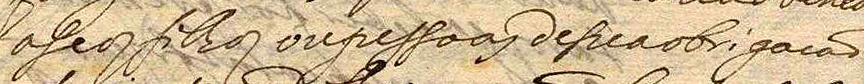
a seoz filhoz ou pessoas de sua obrigaçaõ
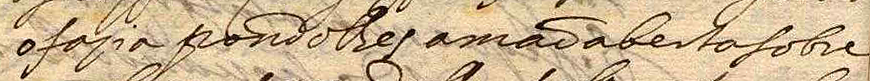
o fazia pondolhes a maõ aberta sobre
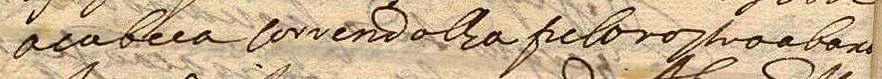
a cabeça correndolha pelo rostro abaxo
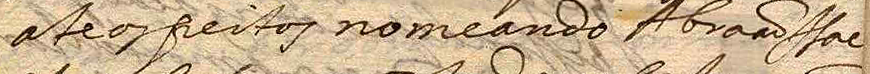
ate os peitos nomeando Abraaõ Jsac
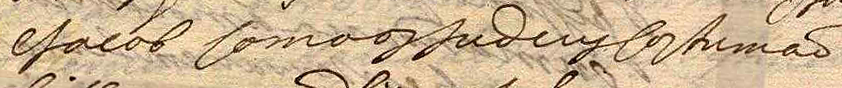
e Jacob Como os judeus costumaõ
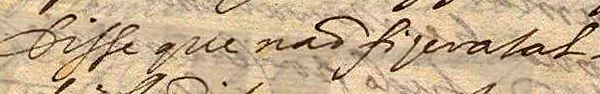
Disse que naõ fizera tal
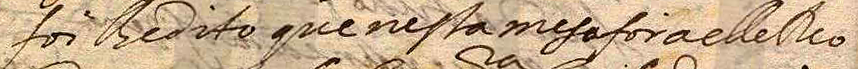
foi lhe dito que nesta mesa fora elle Reo
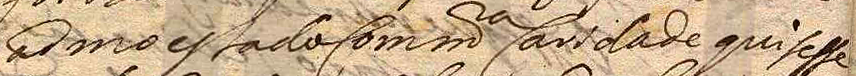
admoestado Com mta Caridade quisesse
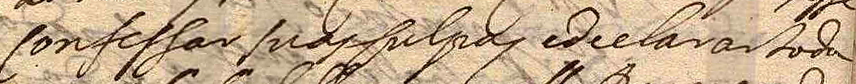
confessar suas Culpas e declarar toda
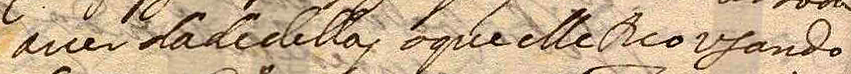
a uerdade dellas o que elle Reo vsando
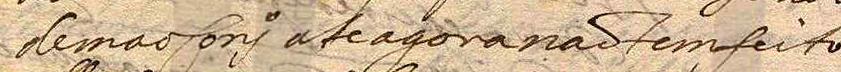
de mao Conso ate agora naõ tem feito
